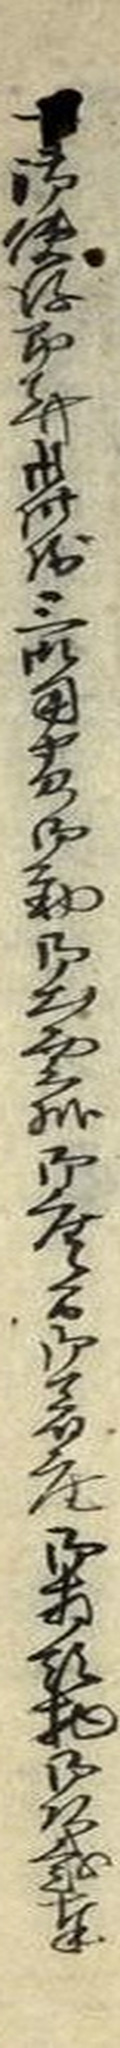一御使後即刻御供揃三御用番御勤御出殿掛御座之間御着座御拝領物御頂戴奉

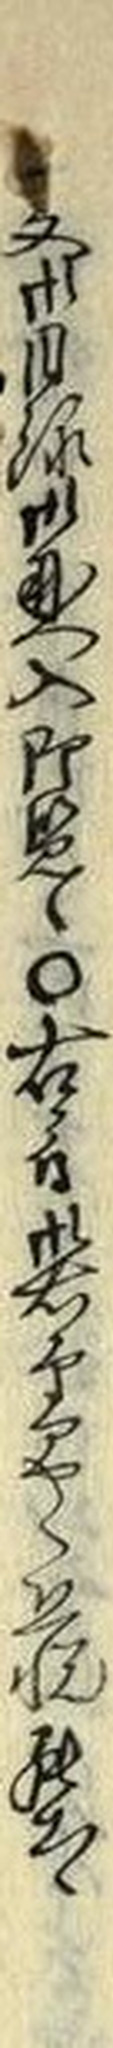文御目録御用人入御覧候〇右ニ付御右筆部屋へ恐悦罷出候
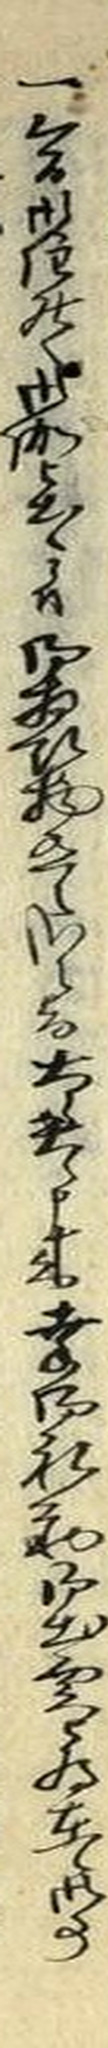一今日御住居へ御伽被出候ニ付御拝領物有之哉之旨大奥へ申来幸御礼勤御出殿被為在候御事
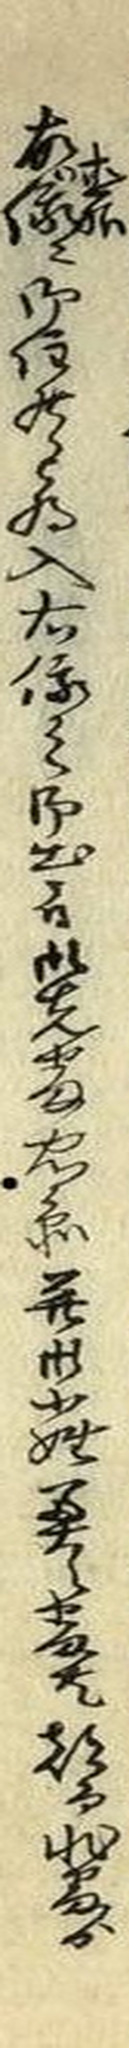故直様俄ニ御住居へ被為入右俄之御出ニ付御先番忠兵衛幷御小姓奥之番共都而非番ゟ
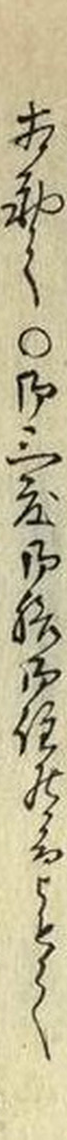相勤之〇御三度御膳御住居ニ而被進之
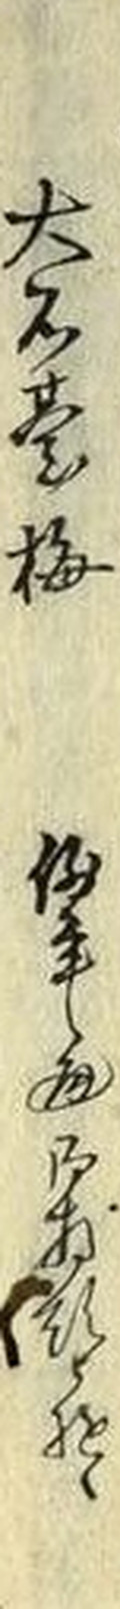大石台梅例年之通御拝領被遊候
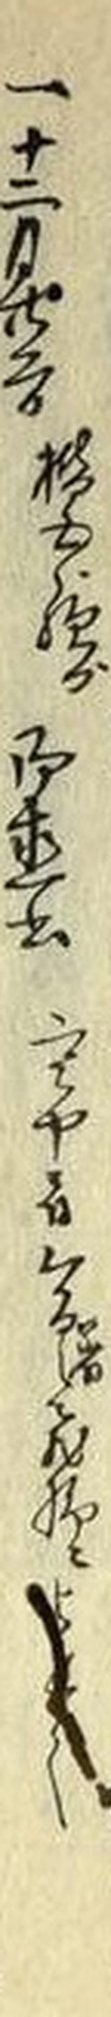一十二月廿二日楷五郎様ゟ御直書寒中ニ付今日着之飛脚ニ被進之
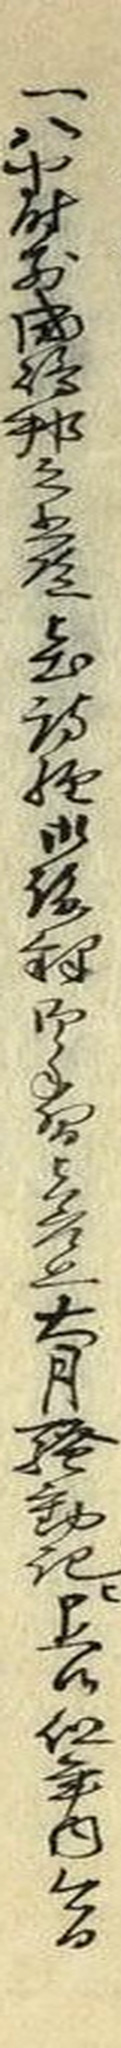一八半時前成嶋邦之丞殿被出詩経御講釈御手習被差上大月騒動記被申上候但年内今日
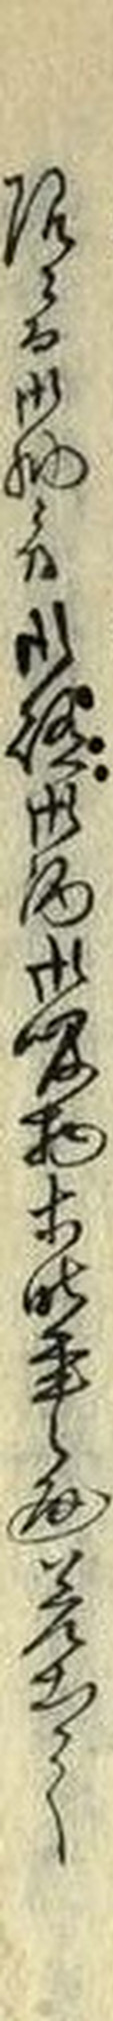限ニ而御納ニ付御賄御酒御吸物等昨年之通差出之
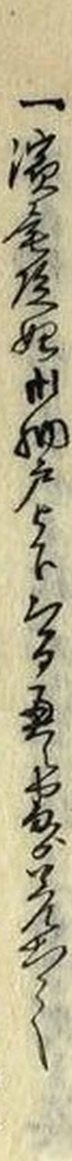一浜尾殿始御納戸被下今日奥之番ゟ差出之
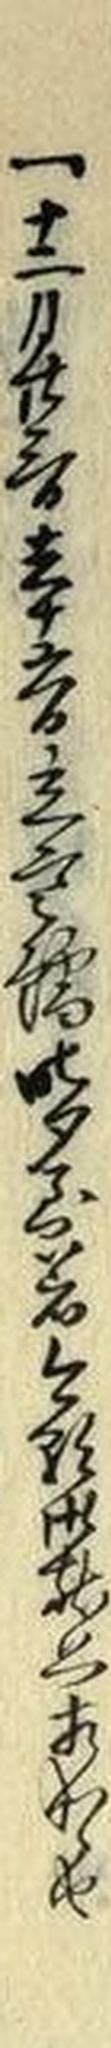一十二月廿三日去十六日立寒鱈昨夕到着今朝御献上相成候由
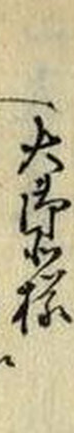大御所様
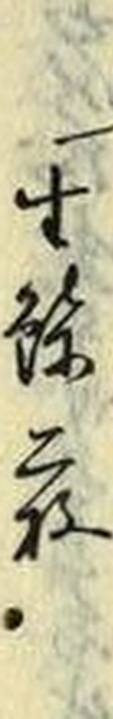生鰈二枚
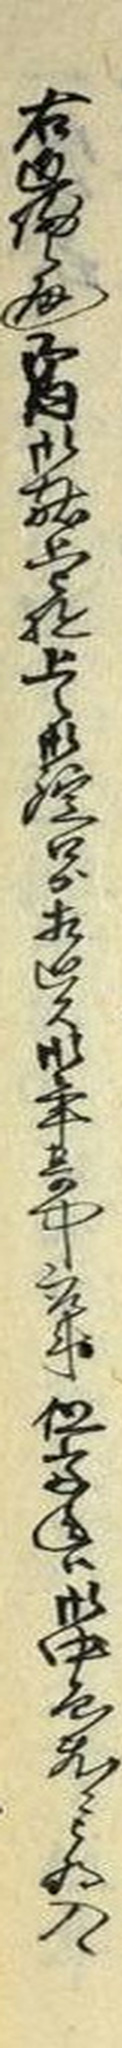右御例之通御内御献上被遊上之御錠口ゟ相廻ス御年寄中取計但当年ハ御中屋敷ニ被為入候
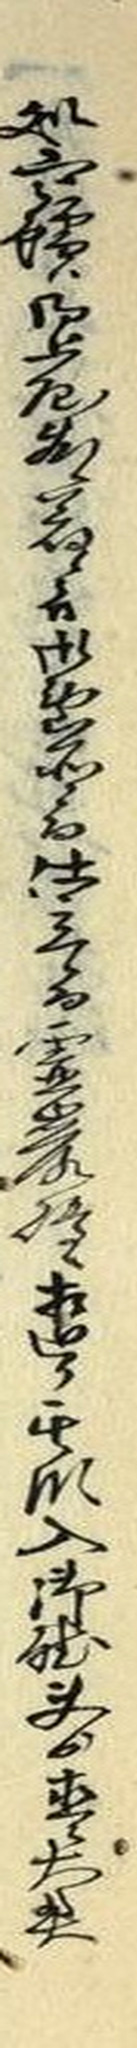処寒鱈ハ御上屋敷へ着ニ付御台所ニ而仕立候而霊厳嶋へ相廻り其段入御聴夫ゟ直ニ大奥
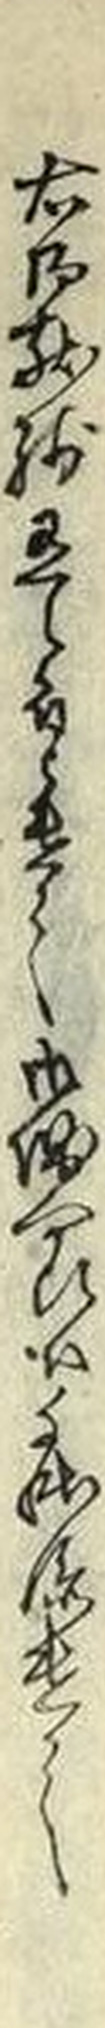右御献残有之ニ付被遣之御側向頭取江手紙添被遣之
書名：少傅日録抄（斉善付側向頭取日記、在府）
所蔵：福井県文書館 Fukui Prefectural Archives
